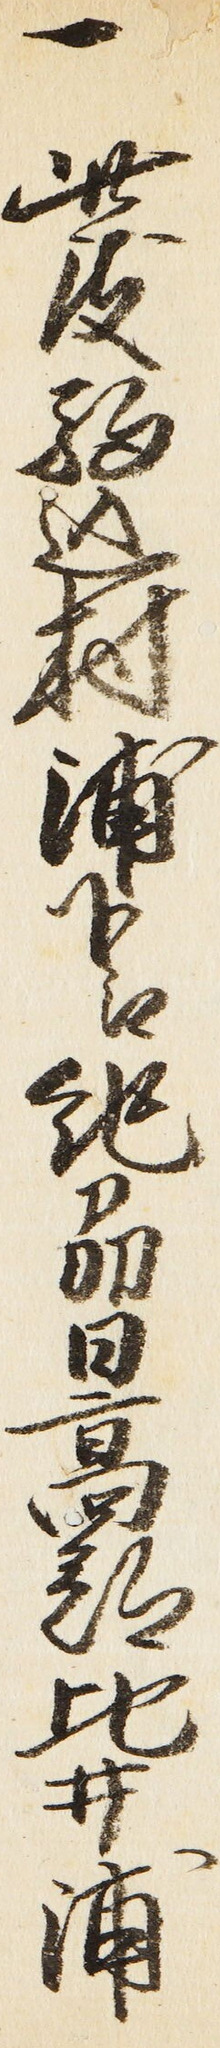一此度駒込村浦下江紀州日高郡比井浦
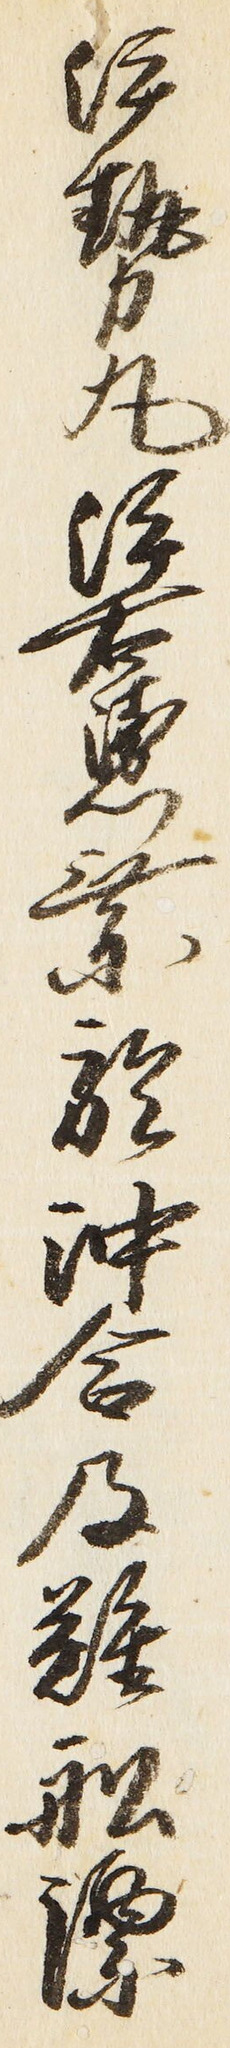伊勢丸伊右衛門乗於沖合及難船漂
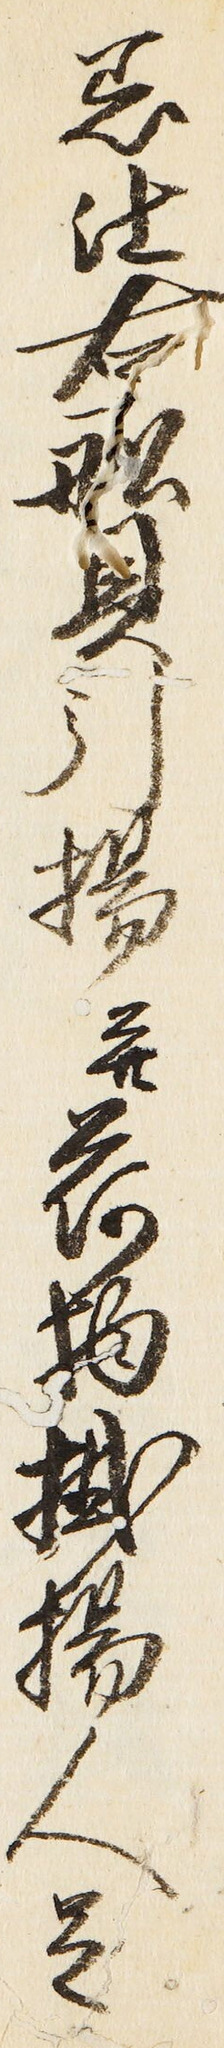着仕右船具引揚并荷物掛揚人足
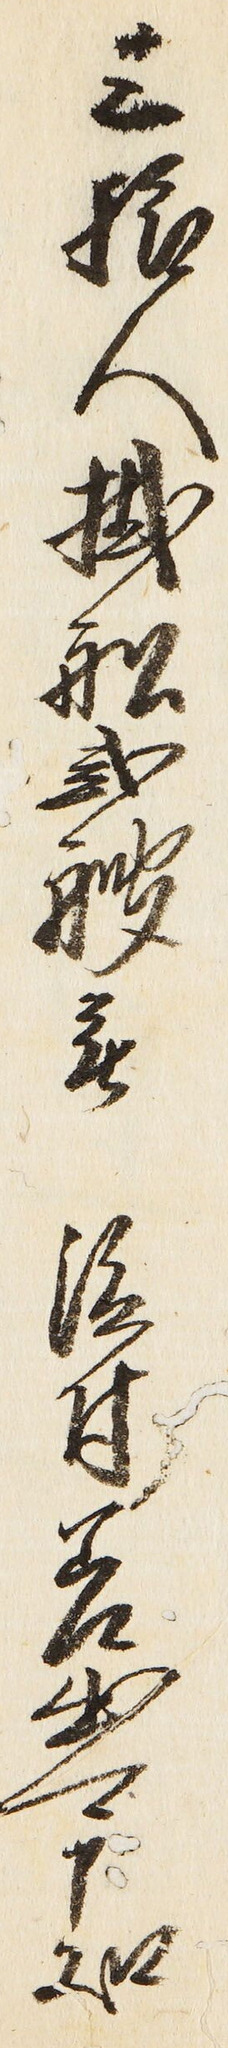三拾人掛船弐艘被仰付差出可申処
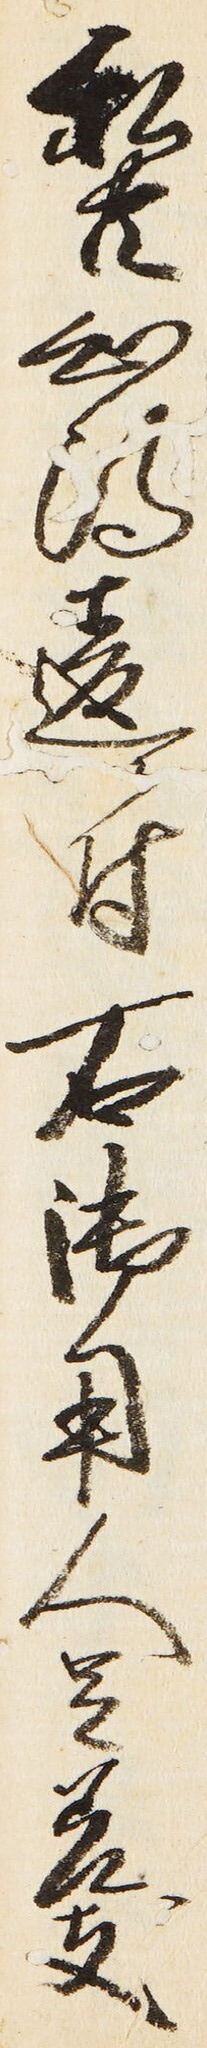私共知行違ニ付右御用人足差支
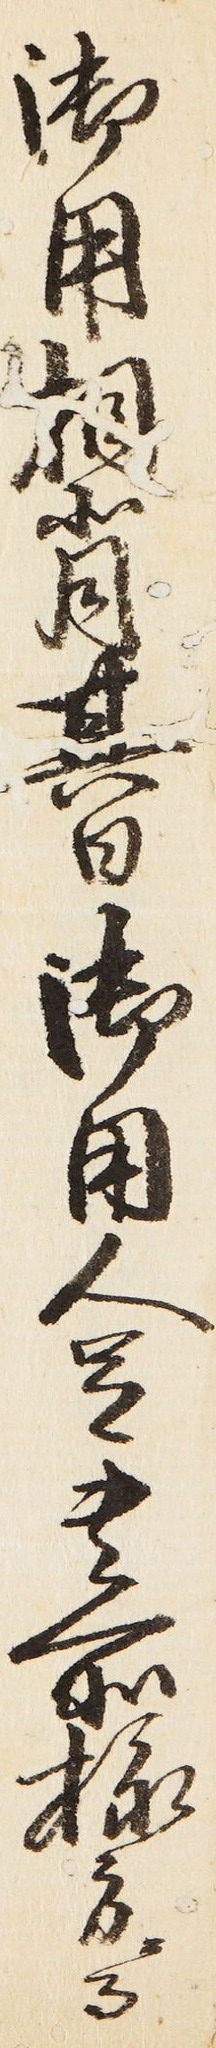御用相背其日御用人足貴所様方ニ而
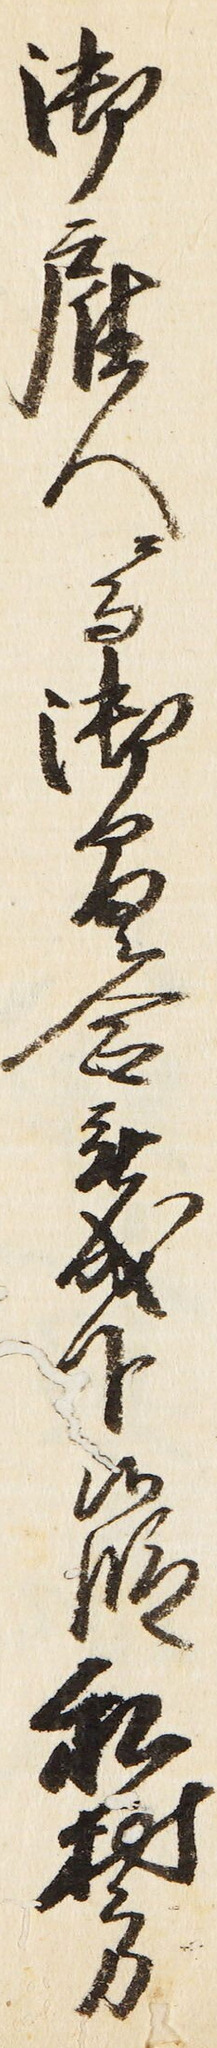御雇人ニ而御間ニ合被成下候段私村方
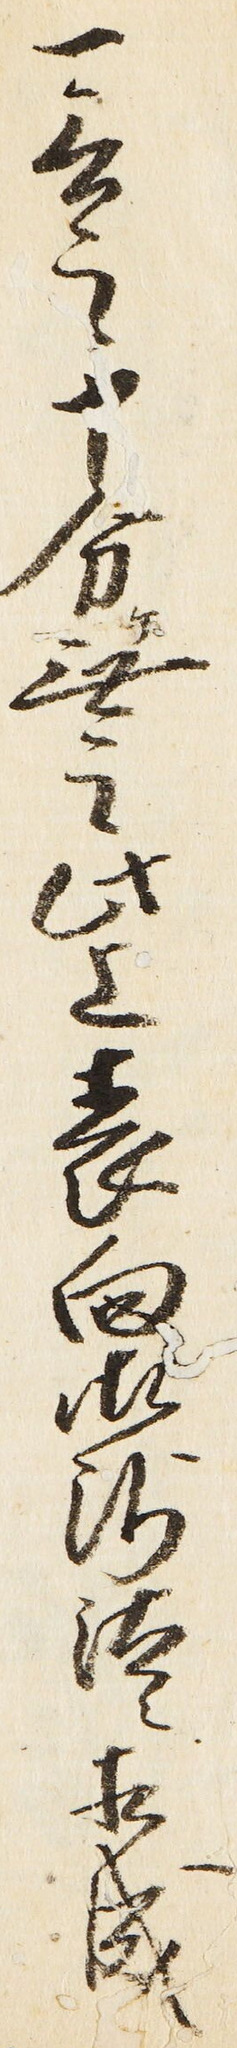一言之申分無之此上表向御沙汰ニ相成
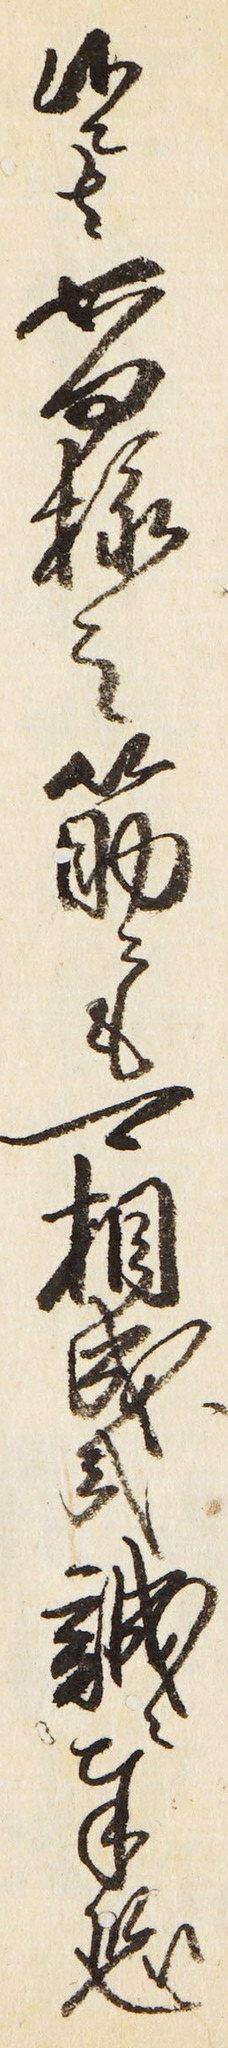候て者如何様之筋ニも可相成哉誠ニ奉恐
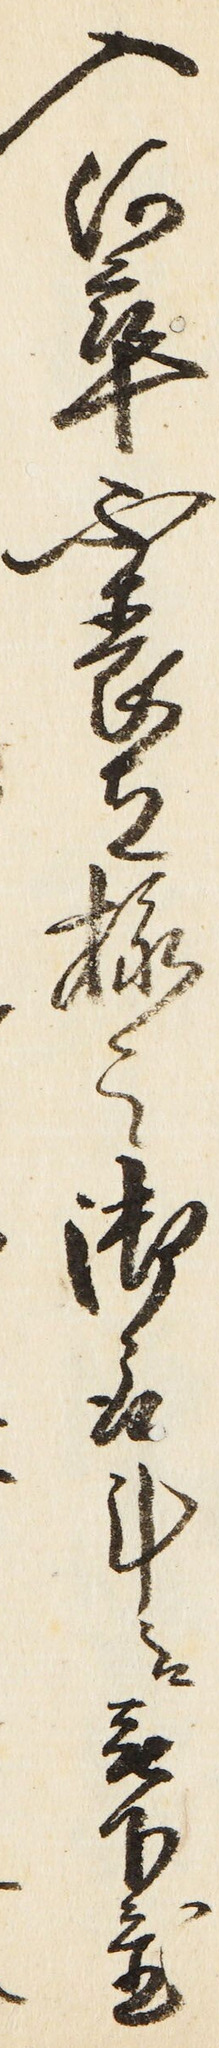入何卒不表立様之御取計計被下置
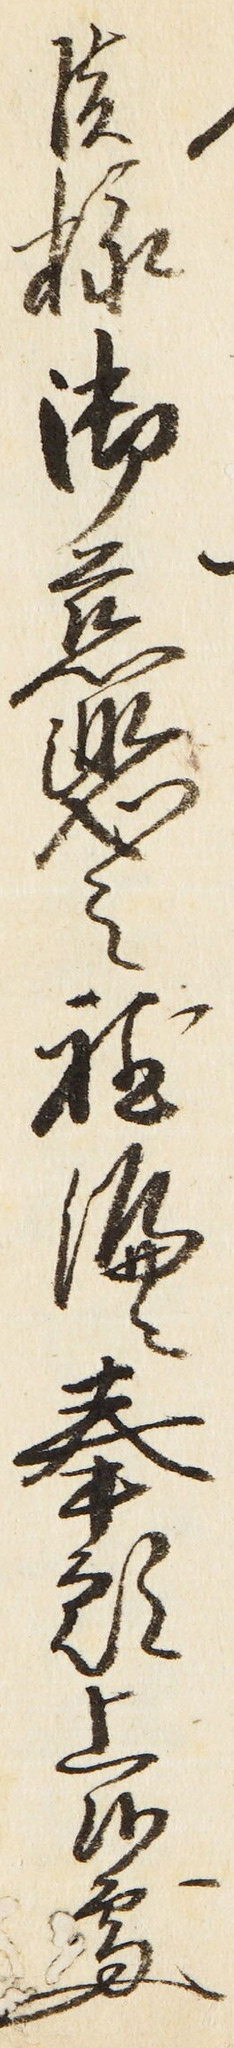候様御慈悲之程偏ニ奉願上候処
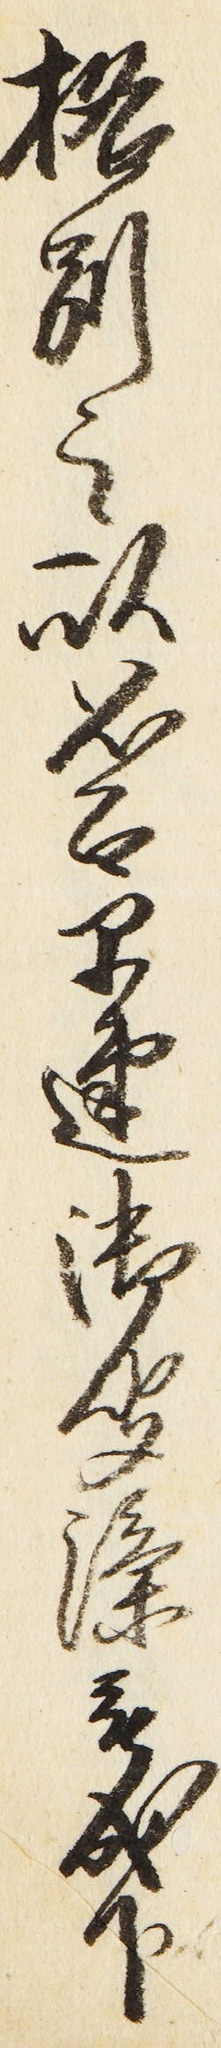格別之以思召早速御聞済被成下

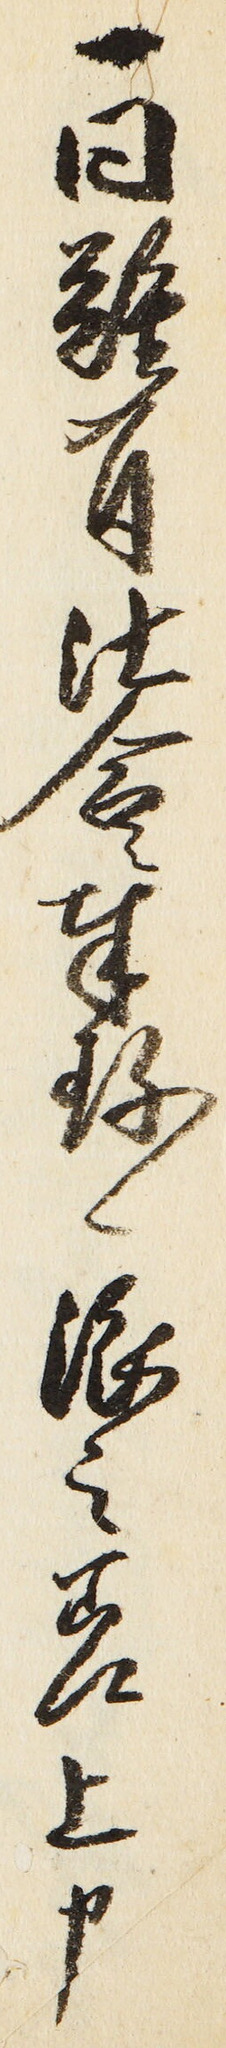一同難有仕合ニ奉存候依之差上申
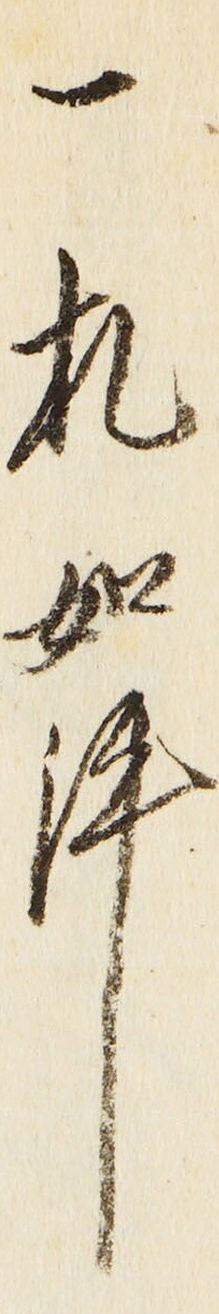一札如件
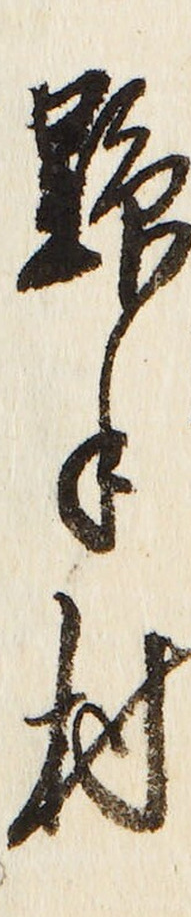野手村
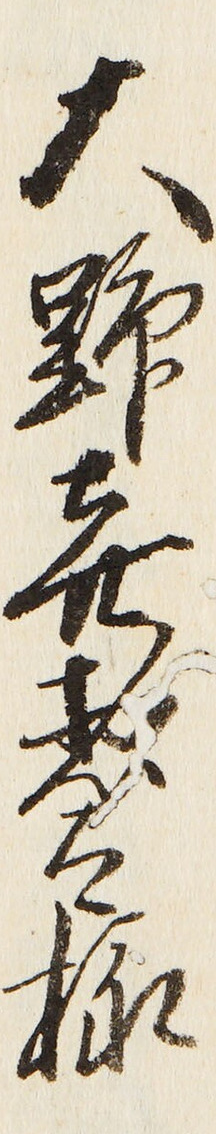大野喜惣太様
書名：難船一件記録
